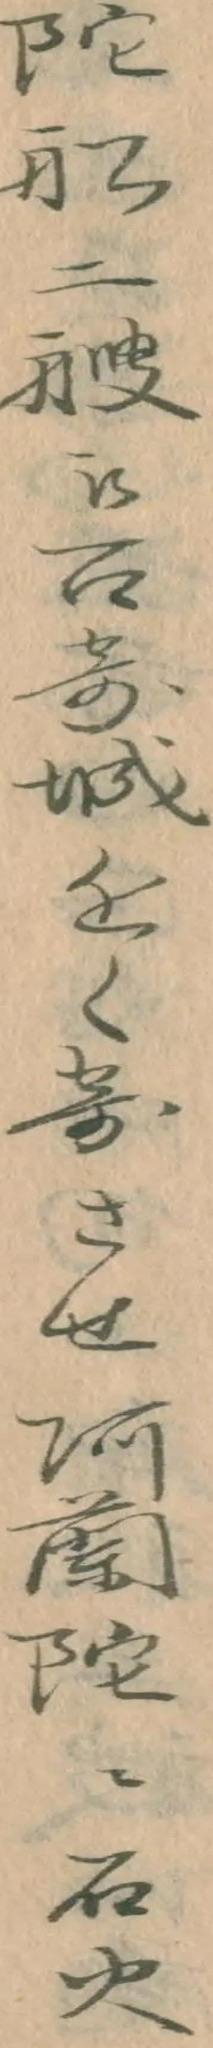陀舩二艘被召寄城近く寄させ阿蘭陀に石火
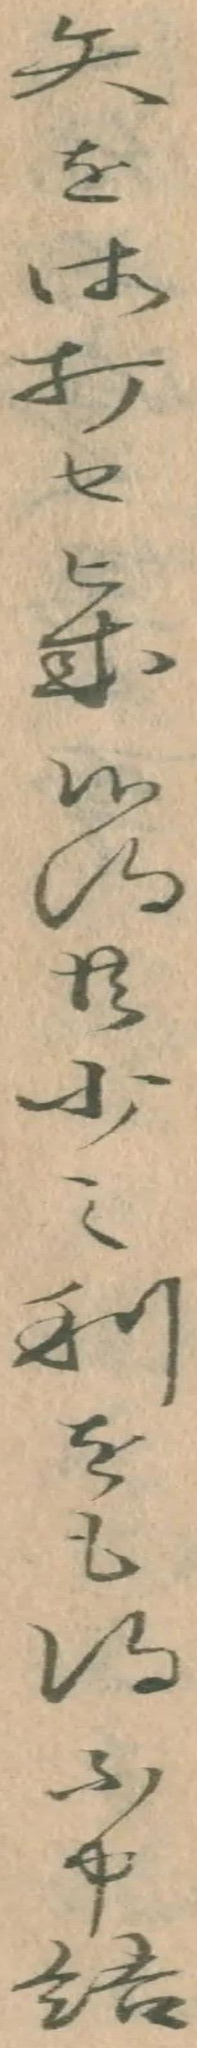弥を御打せ被成候得共少之利をも得ふ申結
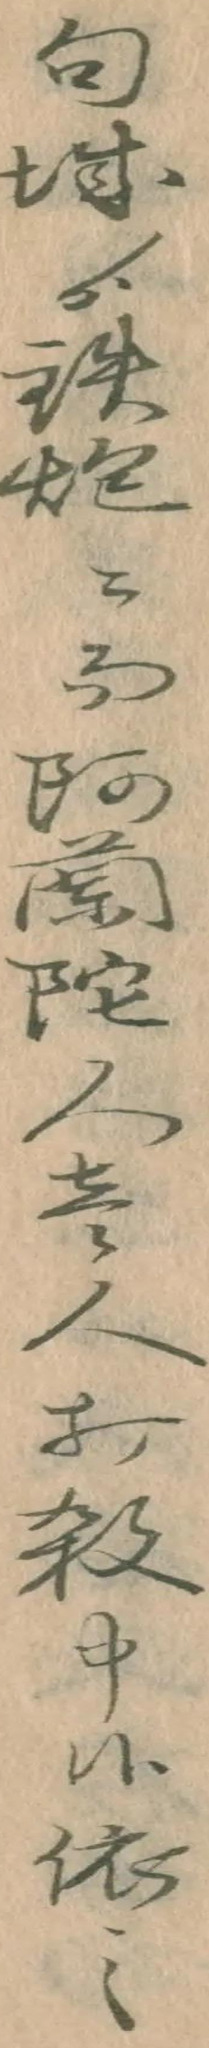句城ゟ鉄炮に而阿蘭陀人壱人打殺申候依之
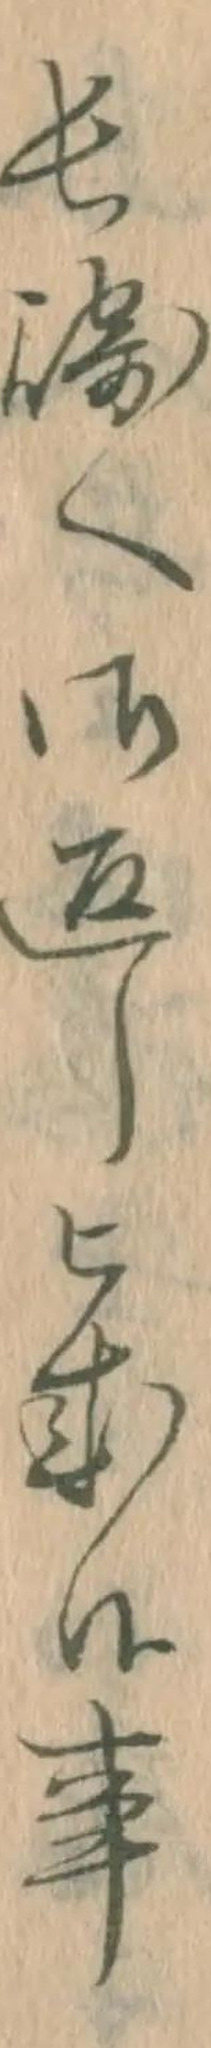長崎へ御返し被成候事
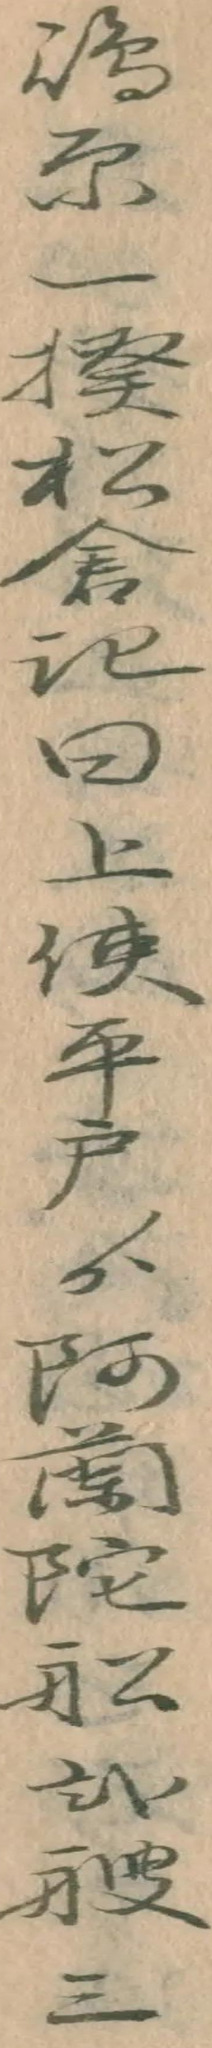島原一揆松倉記曰上使平戸ゟ阿蘭陀舩二艘三
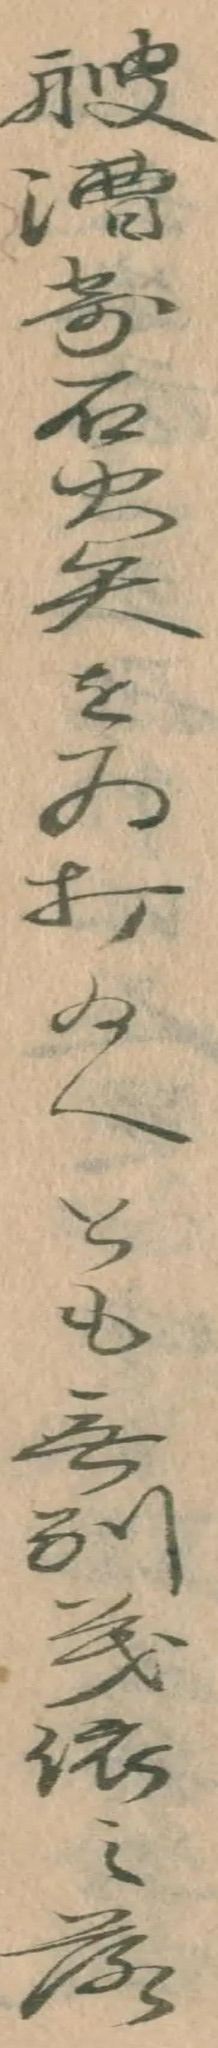艘漕寄石火矢をゐ打ゐへとも無別義依之落
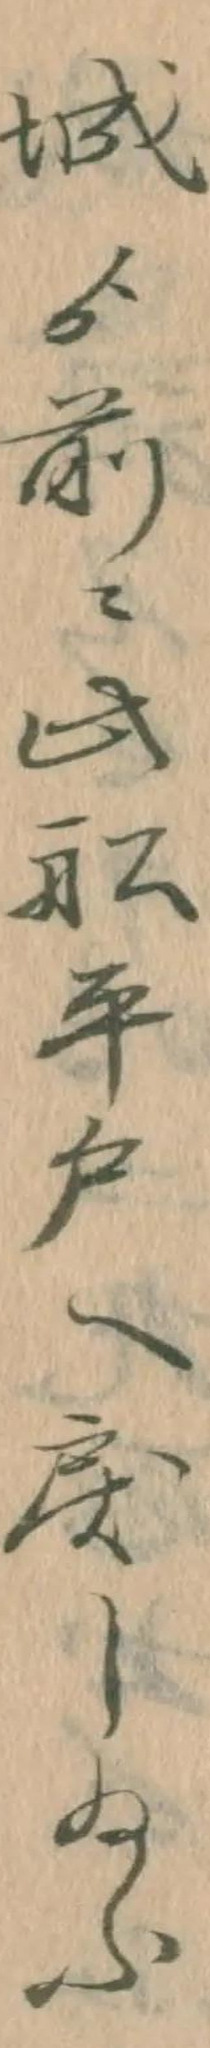城ゟ前に此舩平戸へ戻しゐふ
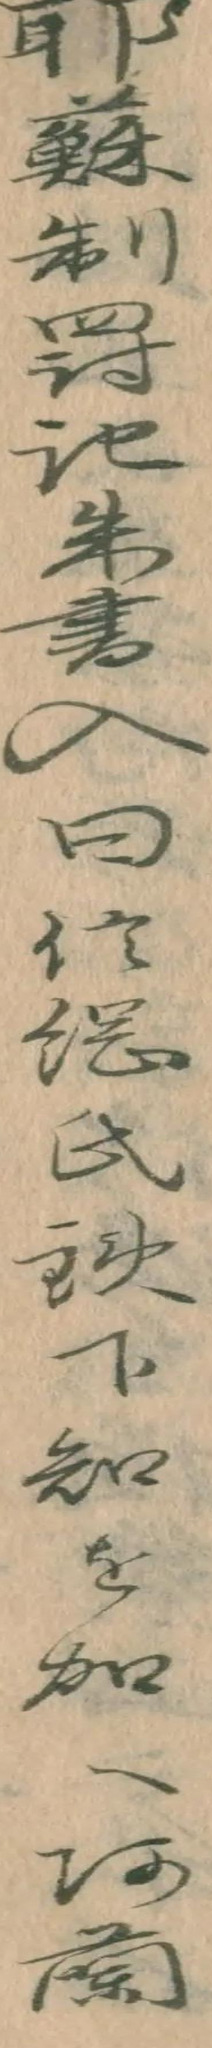耶蘇征罸記朱書入曰信綱氏鉄下知を加へ阿蘭
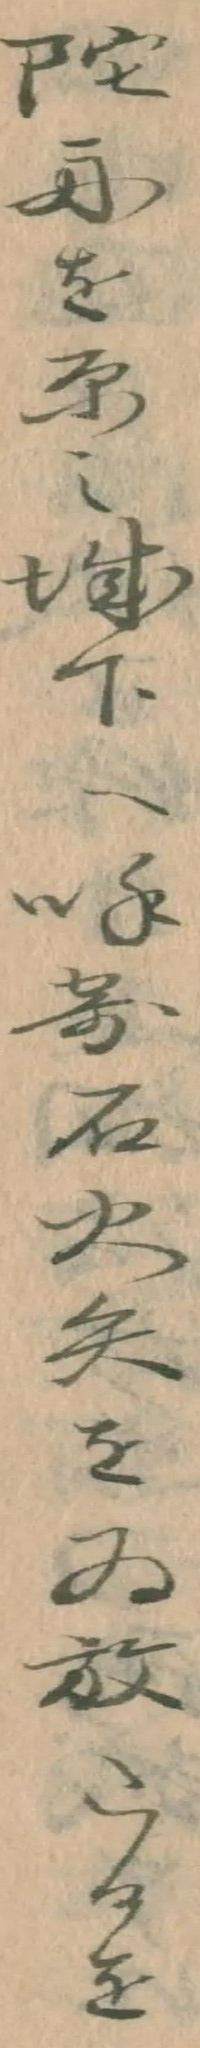陀舟を原之城下へ呼寄石火矢をゐ放たるを
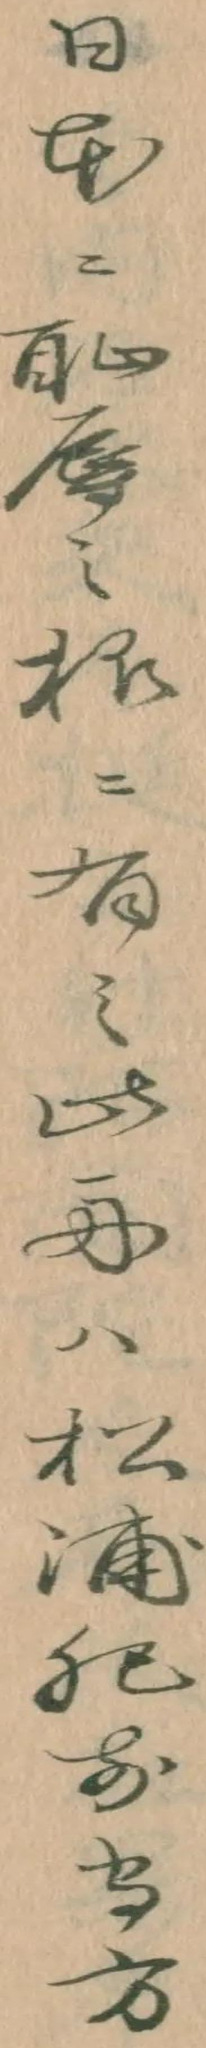日本に恥辱之様に有之此舟は松浦肥前守方
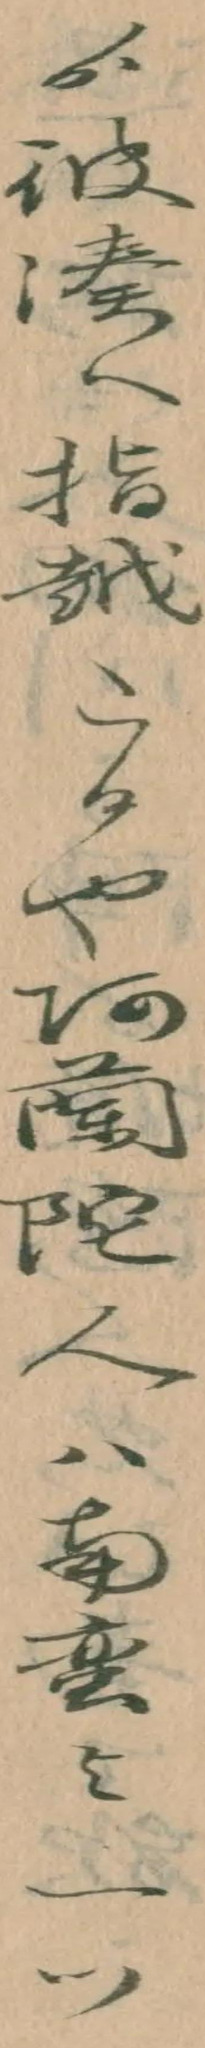ゟ彼湊へ指越たるや阿蘭陀人は南蛮与一つ
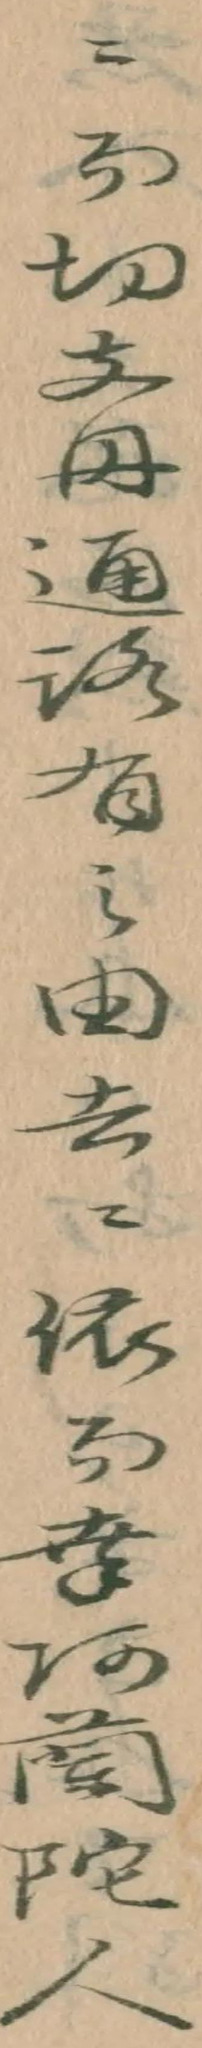に而切支丹通路有之由去に依而幸阿蘭陀人
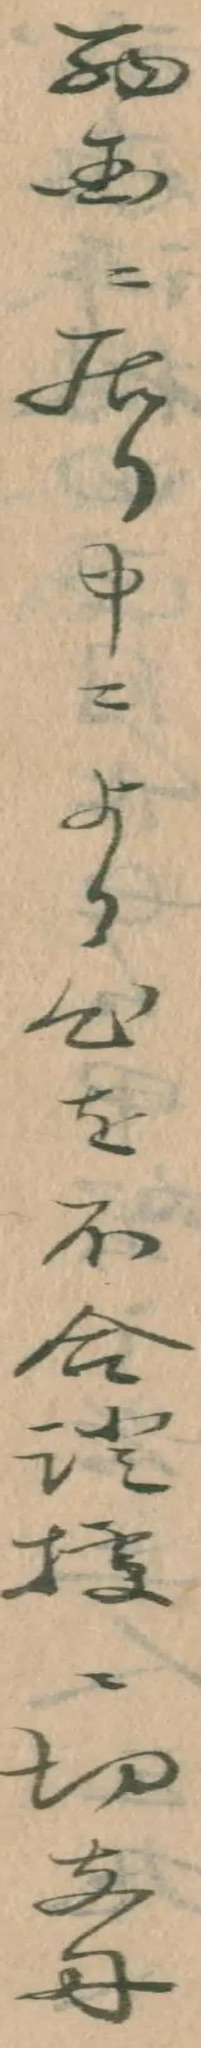西国に居り申により心を不合証拠に切支丹
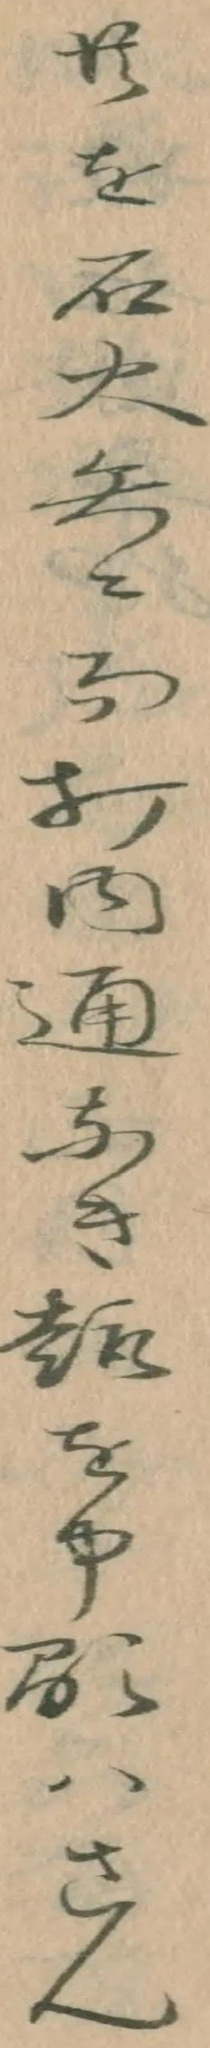共を石火矢に而打内通なき趣を申顕はさん
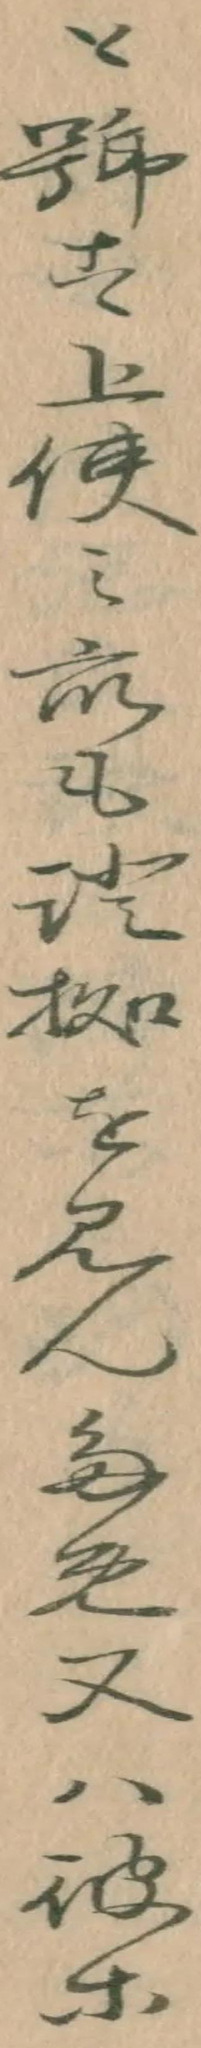と號春上使之衆も証拠を見ん多免又は彼等
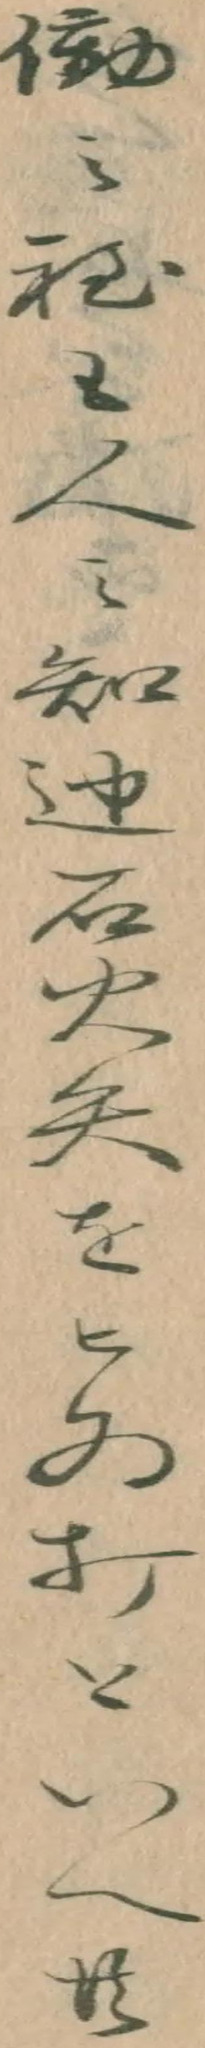働之程も人之知迚石火矢を被ゐ打といへ共
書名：切支丹御退治記 49巻. [6]
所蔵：国立国会図書館 National Diet Library, JAPAN
